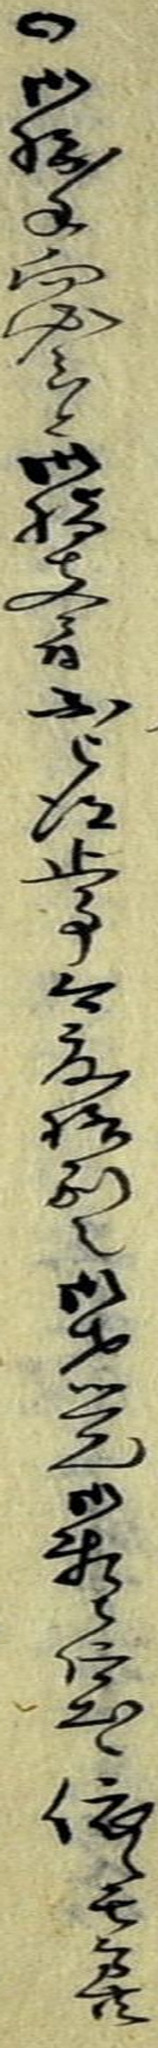〇御勝手向必至と御指支に付不被得止事今度格別之御才覚御頼被仰出候依之其方共
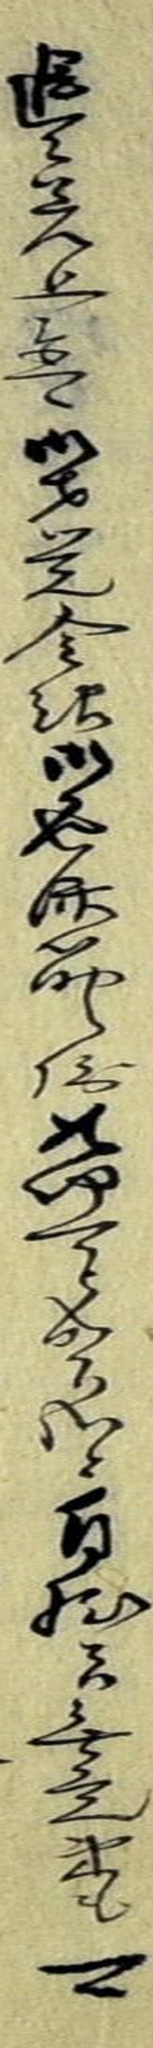追々差上置候御才覚金銀御返済筋之儀如何可被成下哉と自然には無覚束も可
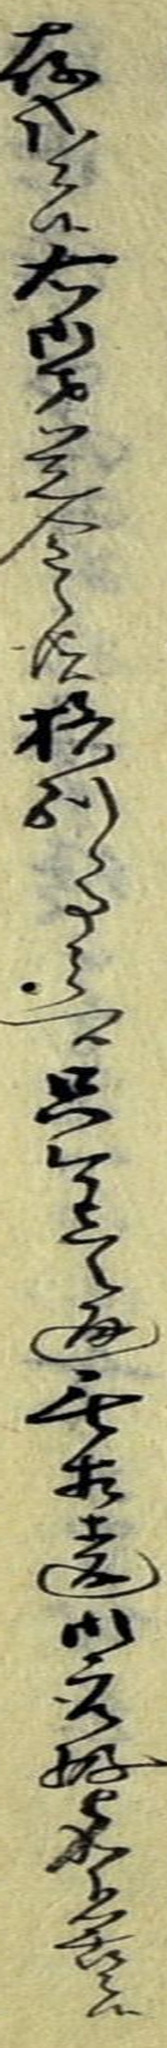存哉に候右御才覚金之儀は格別之事に候へは只今迄之通無相違御取扱被成下筈に候
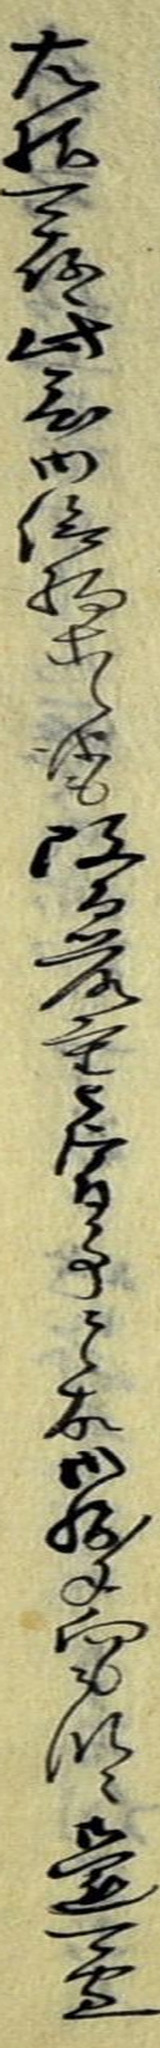右様可存候此度御倹約等之儀も改而厳重被仰付事に候故御勝手向も段々御運可宜

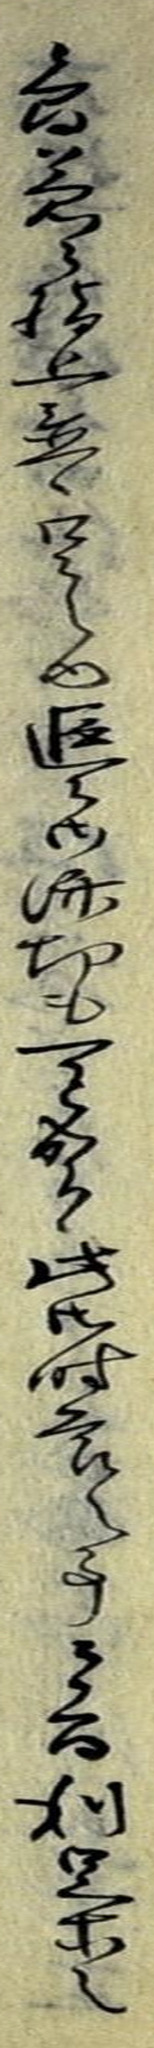候間兼々指上置候口々之内追々御済切も可被成下候此御時節之事に候間利足等之
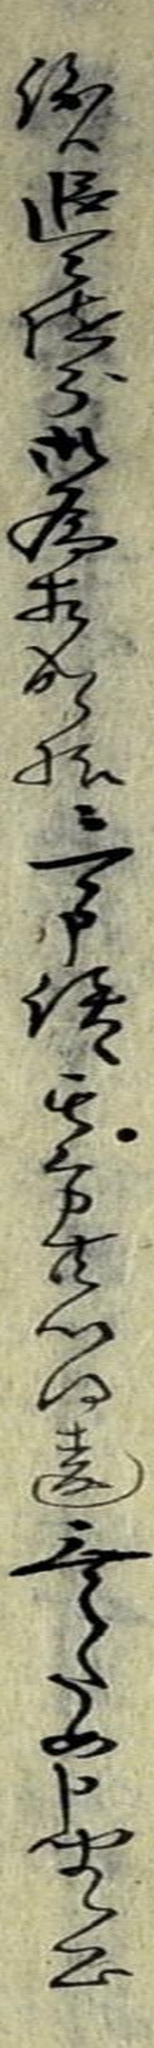儀は追々随分御為相成候様に可申談候其方共心得違無之ため申聞候以上
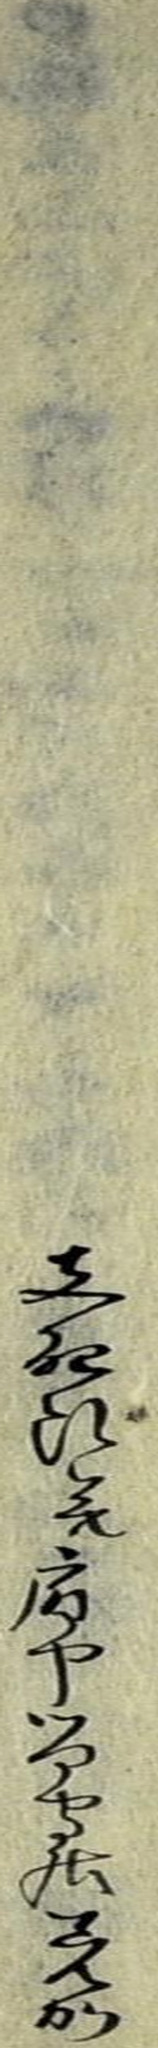支配頭并府中留守居差加
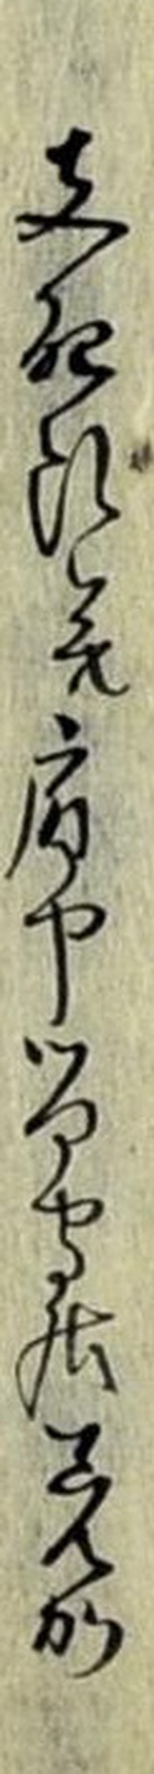支配頭并府中留守居差加
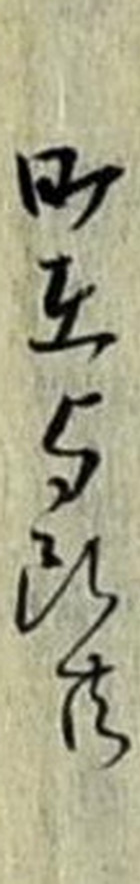町在与頭共
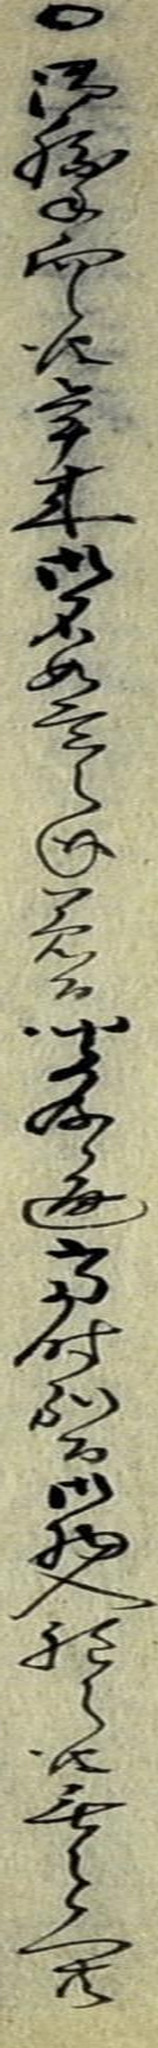〇御勝手向之儀年来御不如意之趣兼而聞及候通当時別而御物入程之儀無之候へ共
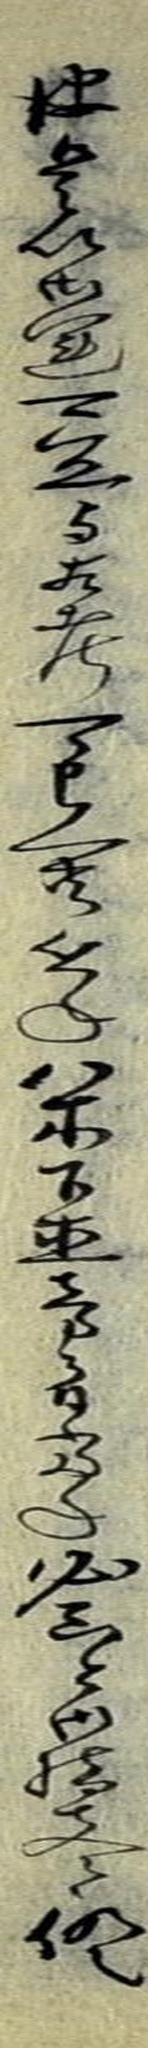彼是以御運可宜与相考可申候へ共近年八木下直旁に付当年必至と御指支に候仍之
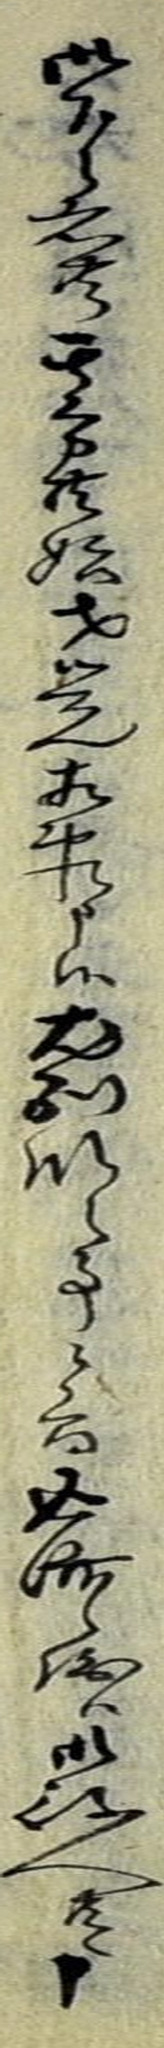御下之者共其方共始才覚相頼申候尤別段之事に候間返済候儀は御役人共へ申
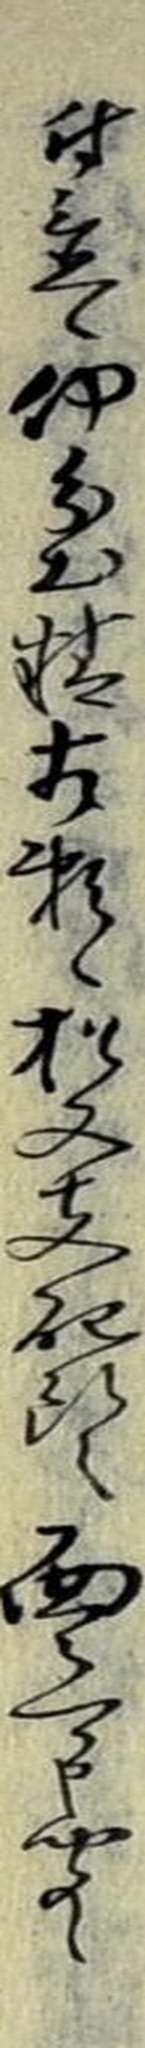付置候何分出精相頼候猶又支配頭之面々可申聞候
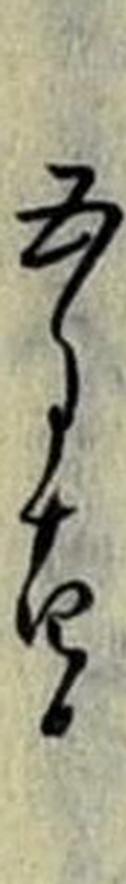五月十四日
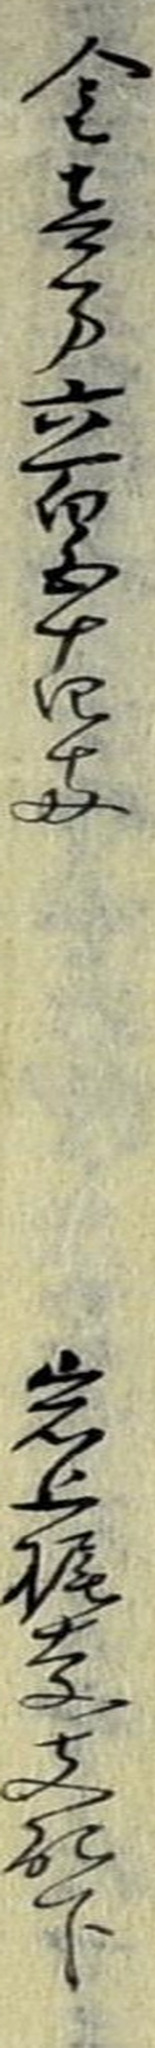一金壱万六百五十四両岩上梶大夫支配下
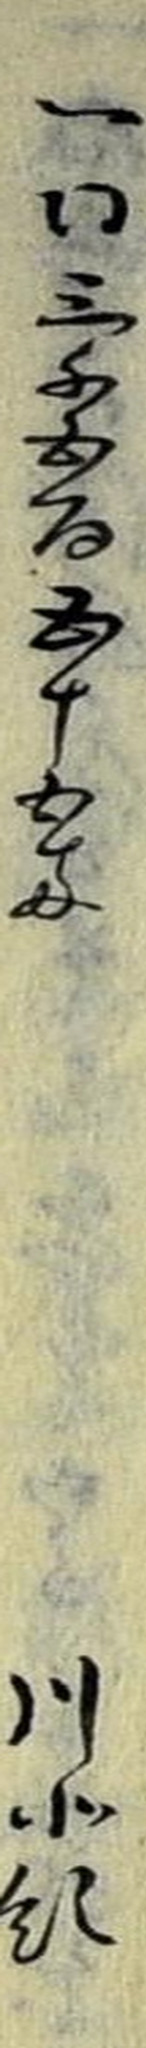一同三千五百五十五両川北領
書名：命令之部 二
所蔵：福井県文書館 Fukui Prefectural Archives
